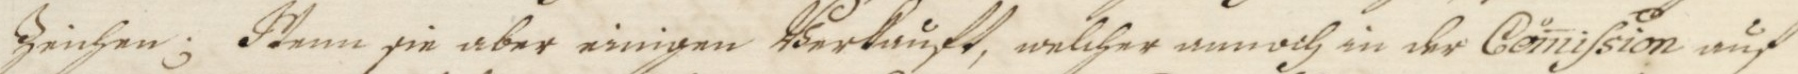Zeichen. Wenn sie aber einigen Verkauft, welcher annoch in der Commission auf
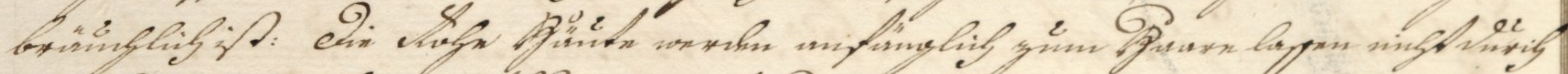bräuchlich ist. Die Rohe Häute werden anfänglich zum Haare lassen nicht durch
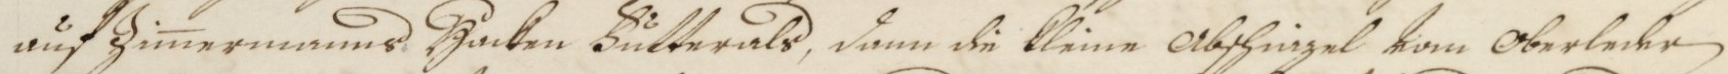auf Zimmermanns Hacken Futterals, dann die kleine Abschnizel vom Oberleder
